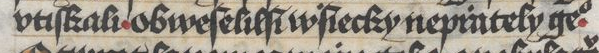vtiſkali.obweſelilſi wẛiecky nepṙately geo
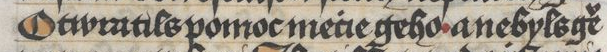Otwratils pomoc meċie geho.a nebyls gev
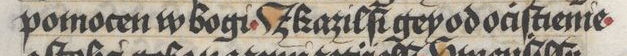pomocen w bogi.Zkazil ſi gey od oċiſtienie.
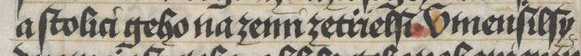a ſtolici geho na zemi zetṙiel ſi.Vmenẛilſy
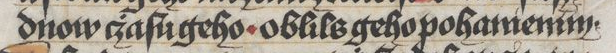dnow cżaſu geho.oblils geho pohanienim.
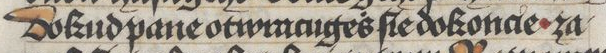Dokud pane otwracugeṡ ſie dokoncie.za¬
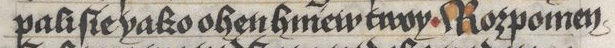pali ſie yako ohen hniew twoy.Rozpomen
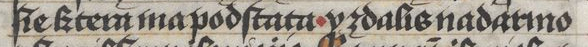ſie ktera ma podſtata.y zdalis nadarmo
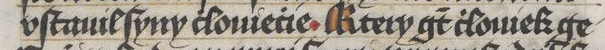vſtzuil ſyny ċlouieċíe.Ktery ḡt ċlouiek ge¬
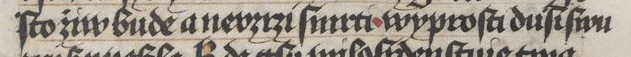ẛto żiw bude a nevzrzi ſmrti.wyproſti duẛi ſwu
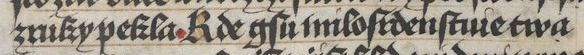zruky pekla.Kde gſu miloſrdenſtuie twa
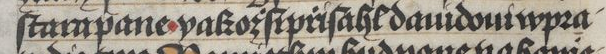ſtara pane.yakoż ſi pṙiſahl dauidoui wpra¬
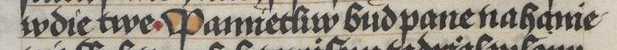wdie twe.Pamietliw bud pane na hanie¬
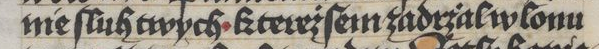nie ſluh twych.ktereż ſem zadrżal wlonu
